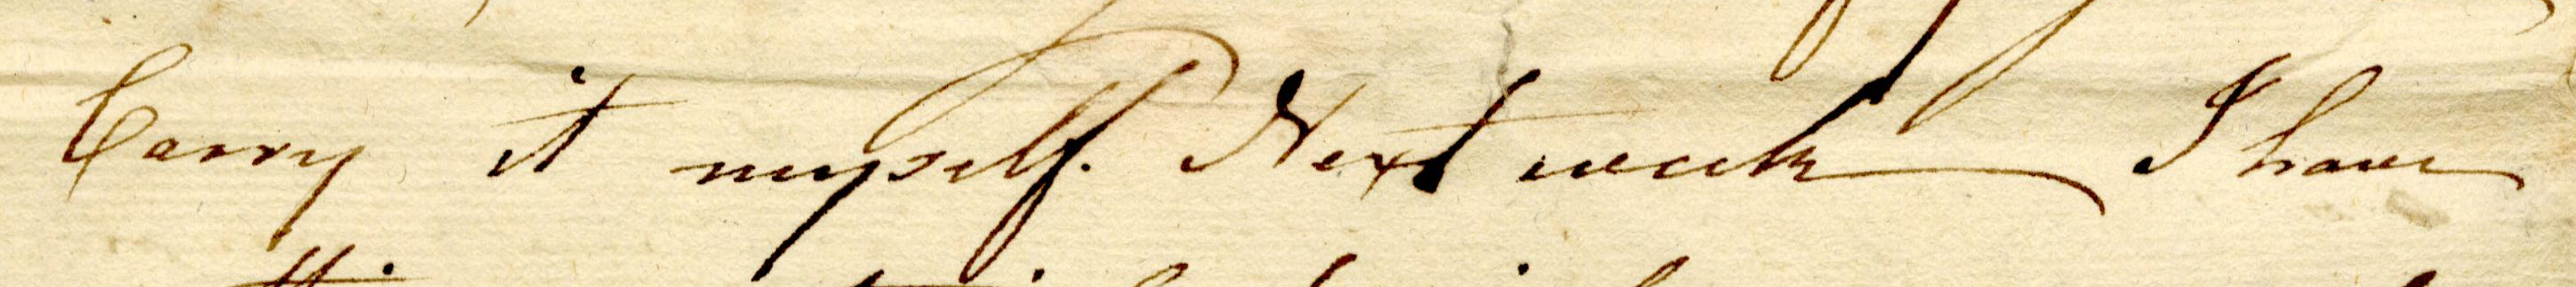Carry it myself. Next week I have
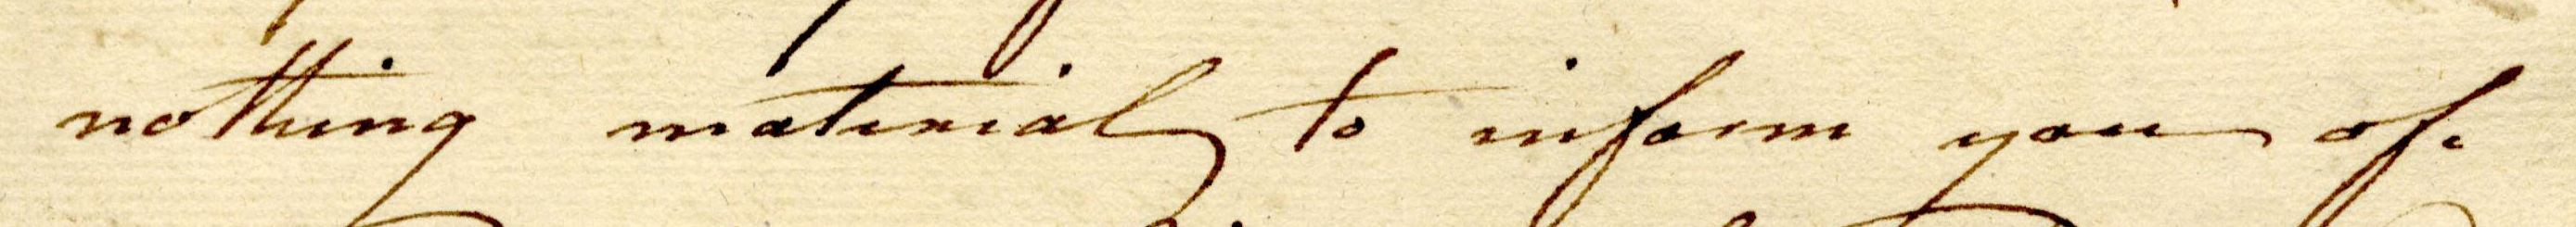nothing material to inform you of.
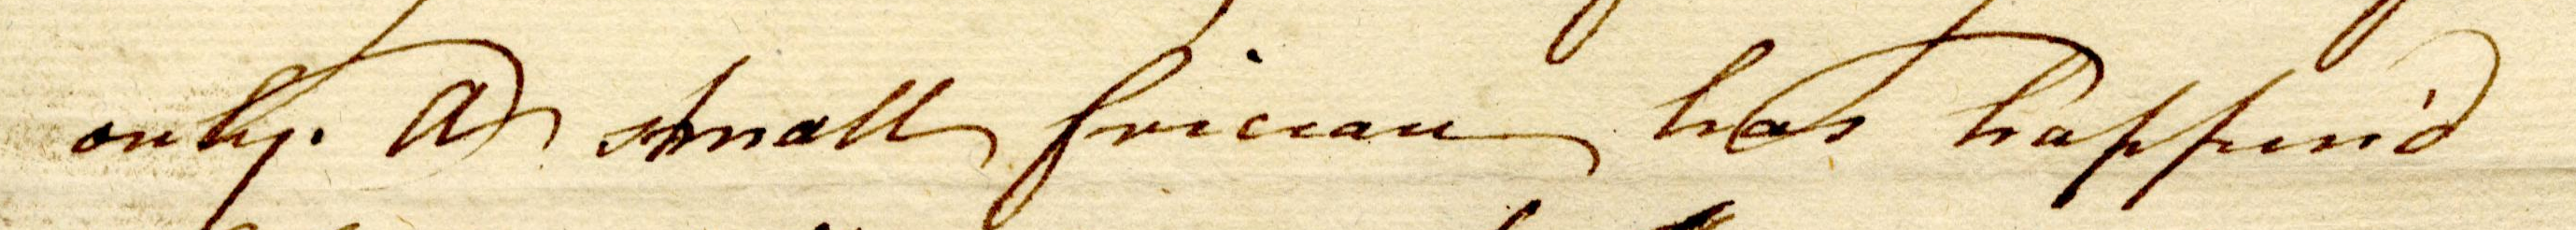only a small friceau has happen'd
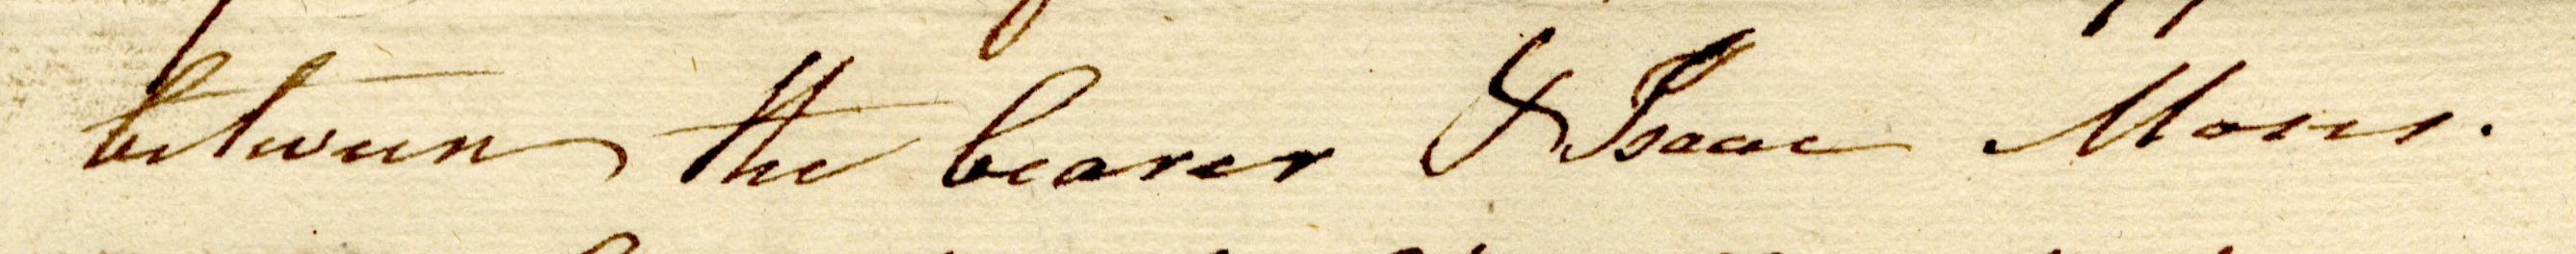betwen the bearer & Isaac Moses.
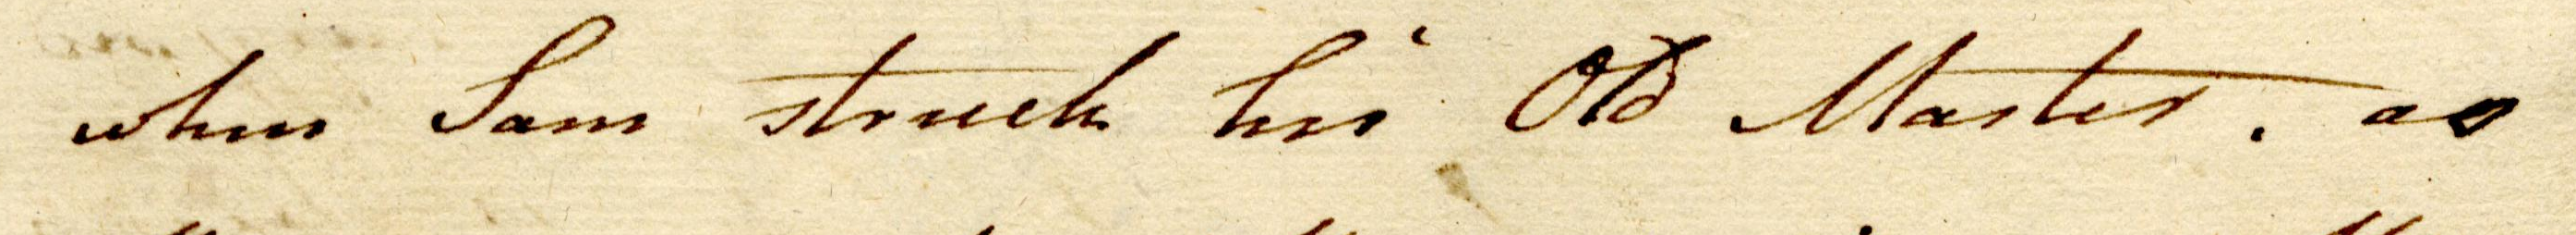when Sams struck his Old Master. as
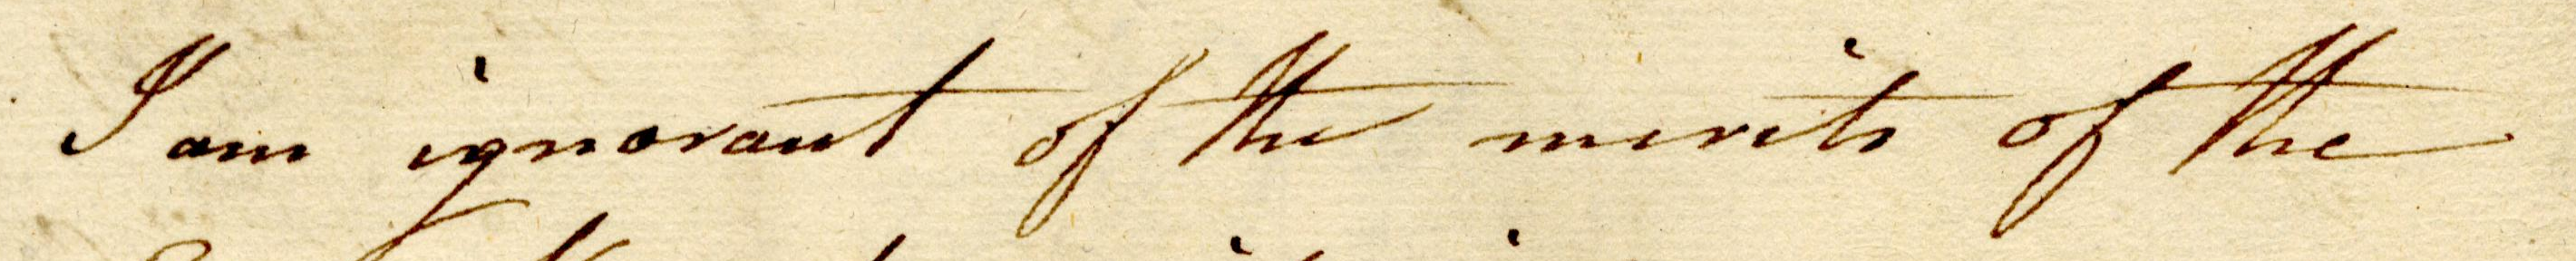I am ignorant of the merits of the
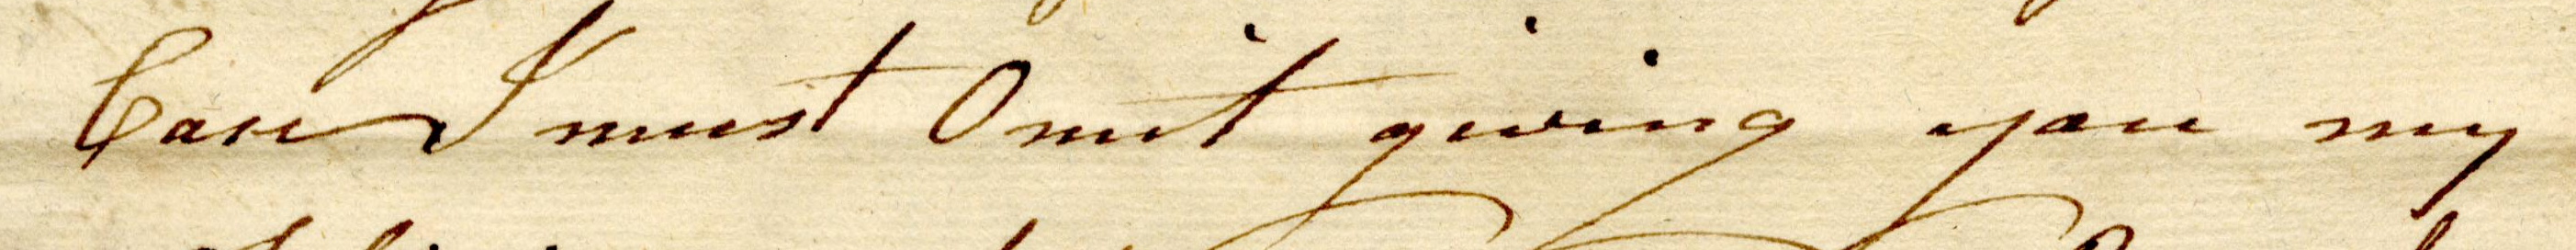Case I must Omit giving you my
